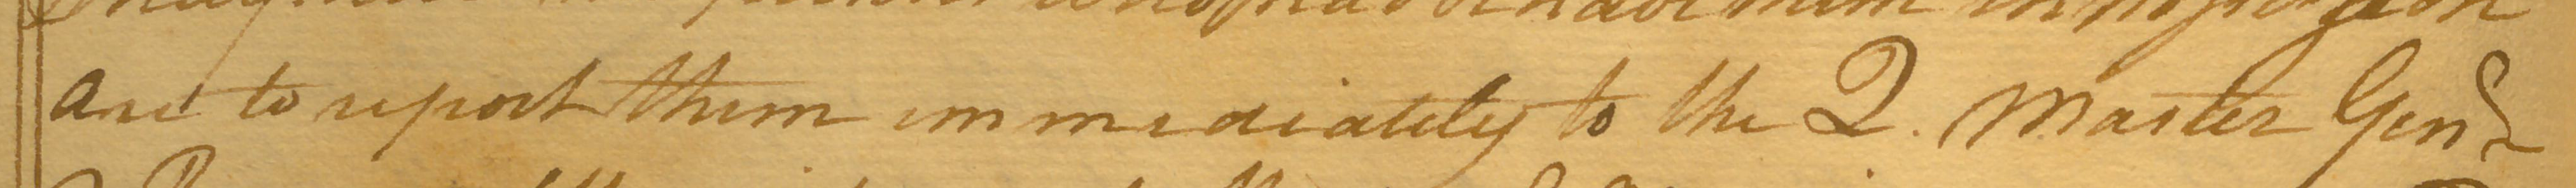are to report them immediately to the Q. Master Gen^l.
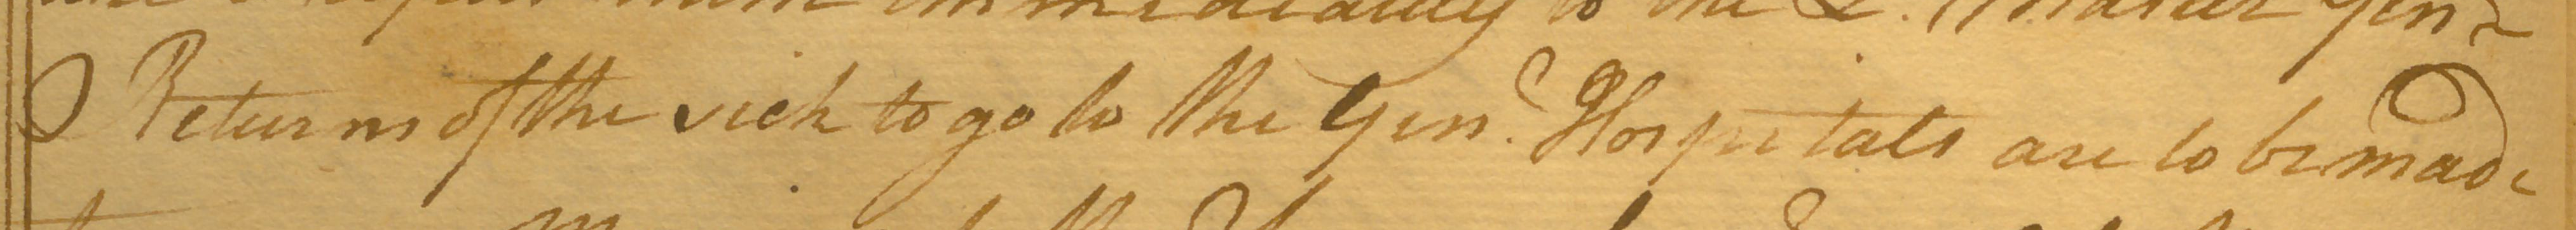& Returns of the sick to go to the Gen^l. Hospitals are to be made
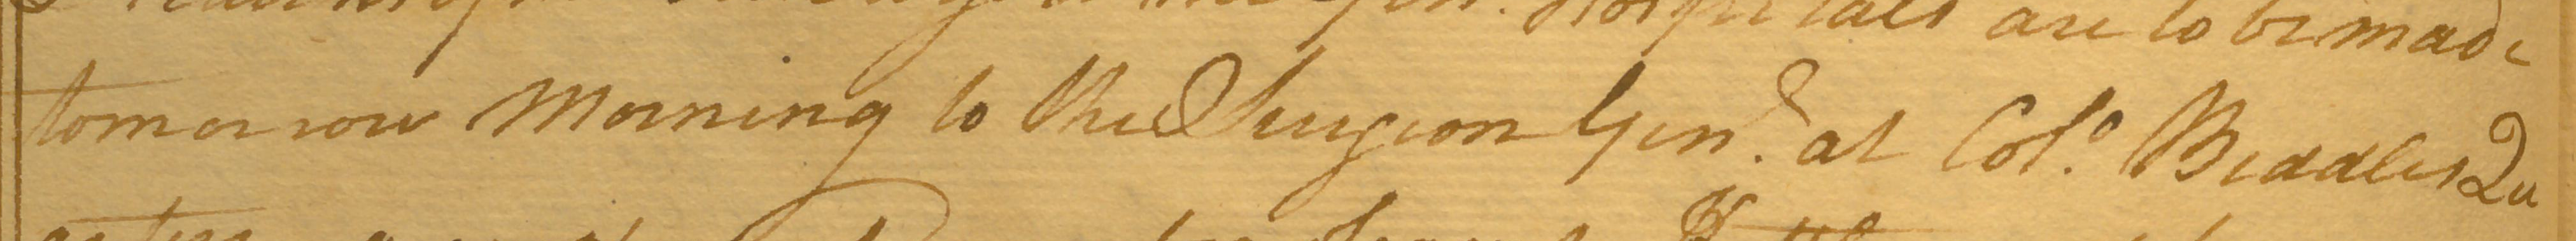tomorrow Morning to the Surgeon Gen^l. at Col^o. Biddles Qu
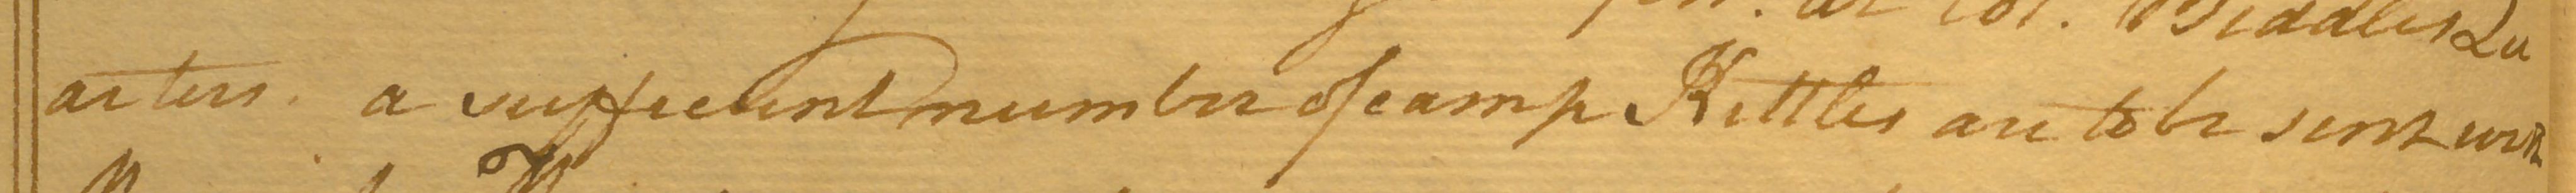arters. a sufficient number of camp Kettles are to be sent with
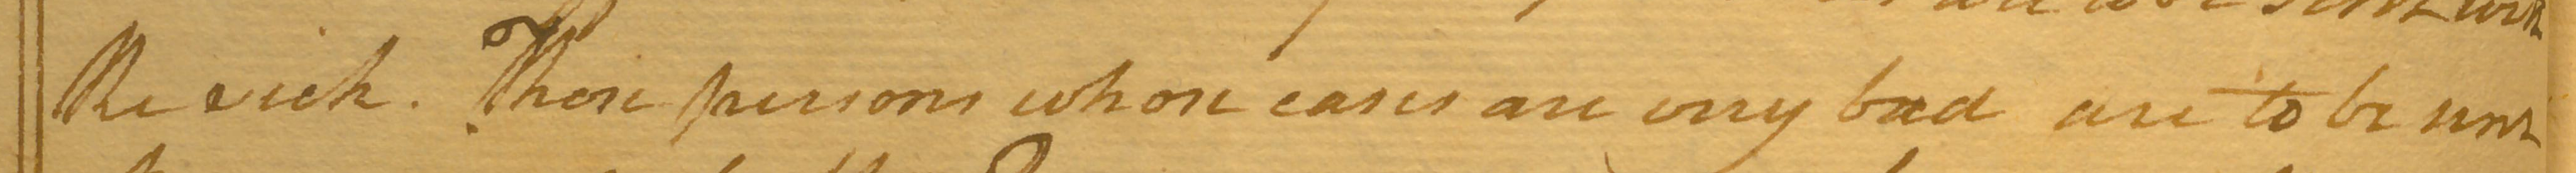the sick. Those persons whose cases are very bad are to be sent
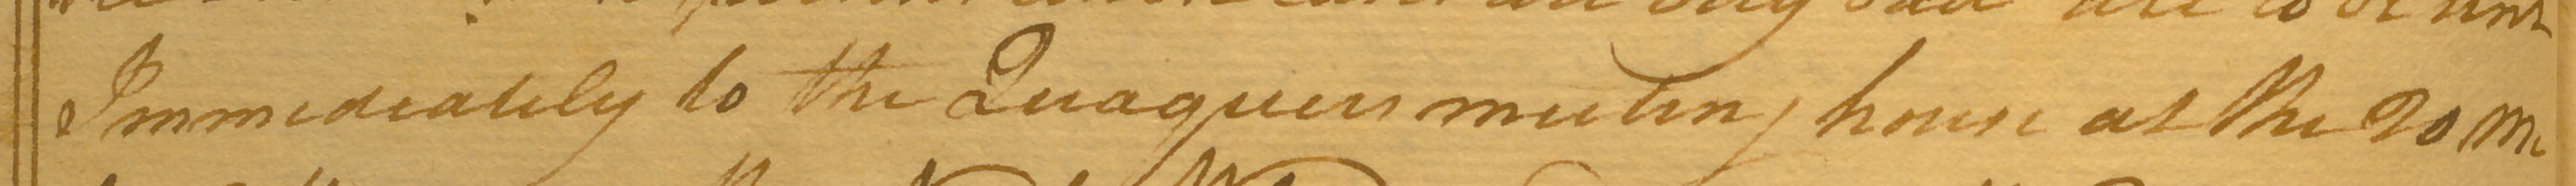Immediately to the Quaquers meeting house at the 20 mi
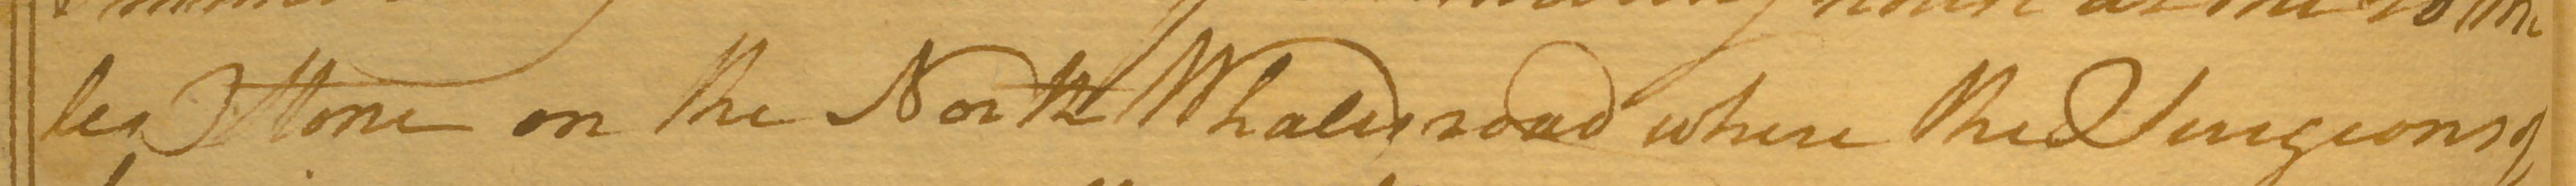les Stone on the North Whales road where the Surgeons of
